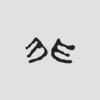非
